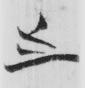之
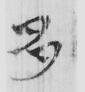多
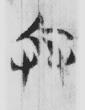兵
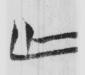亡
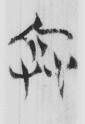兵
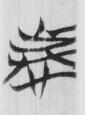者
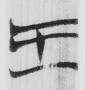王
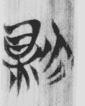則
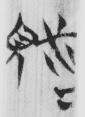{見必}=
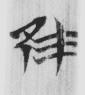隹
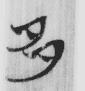多
